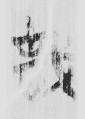哉
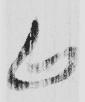㠯（以）
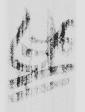爲
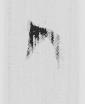人
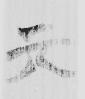亓
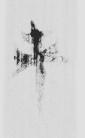末
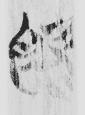{既火}
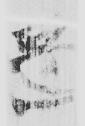是
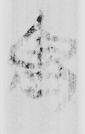胃
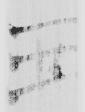玉
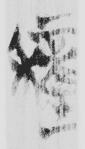穜
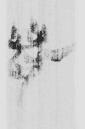{鼠一}
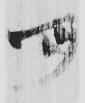月
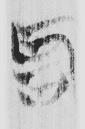{㠯ㅋ}
